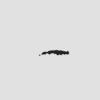一
